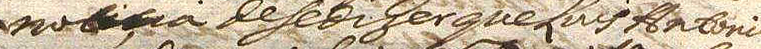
notiçia de se dizer que Luis Antonio
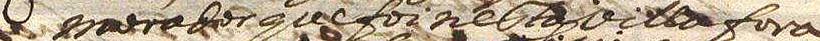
morador que foi nesta villa fora
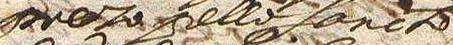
prezo pello sancto
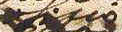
ofisio
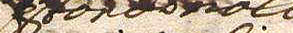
estando na Ci
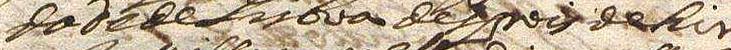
dade de Lisboa depois de hir
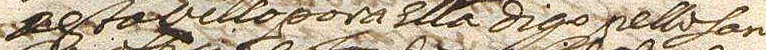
desta villa para Ella digo pello san
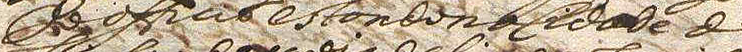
to officio estando na Cidade de
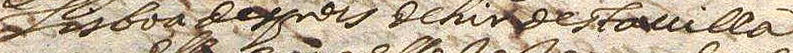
Lisboa despois de hir desta uilla
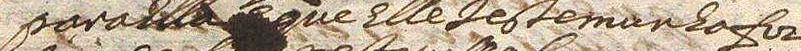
para Ella E que Elle testemunha foi
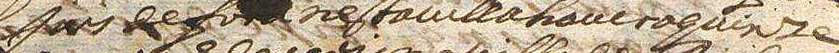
Juis de fora nesta uilla hauera quinze
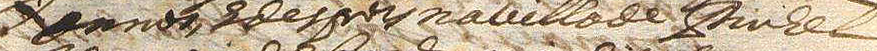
annos, E despois na uilla de Pinhel
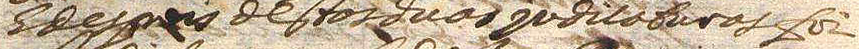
E despois destas duas judicaturas foi
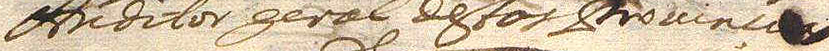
Auditor geral destas Prouinçias
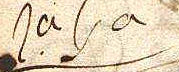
I.a Ta
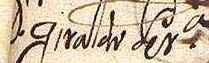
D.r giraldo Pera.
